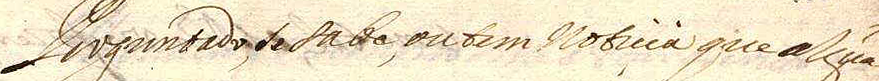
Perguntado, se sabe, ou tem notiçia que algūa
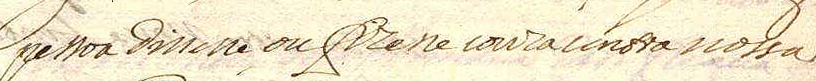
pessoa dissesse, ou fizesse couza contra nossa
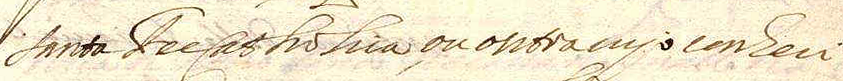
Santa Fee Catholica, ou outra cujo conheci
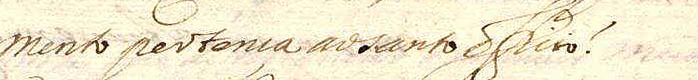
mento pertença ao santo Officio?
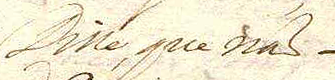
Disse, que naõ
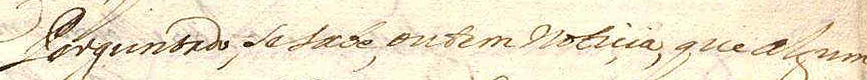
Perguntado, se sabe, ou tem notiçia, que algum
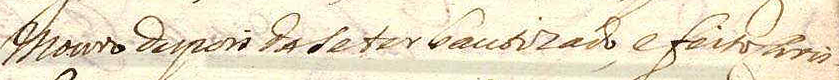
Mouro despois de se ter bautizado, e feito Chris
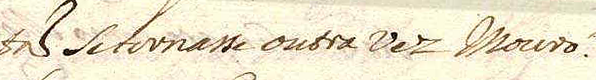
taõ, se tornasse outra vez Mouro?
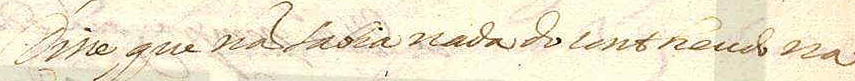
Disse, que naõ sabia nada do contheudo na
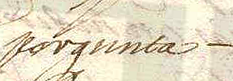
pergunta ‑
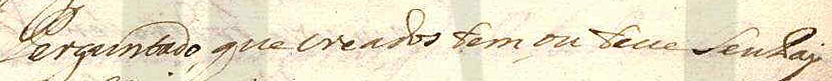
Perguntado, que creados tem, ou teue Seu Pay
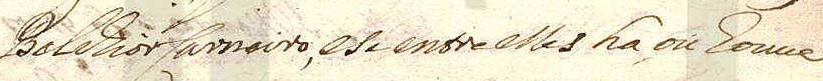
BeLchior Carneiro, e se entre elles ha, ou houue
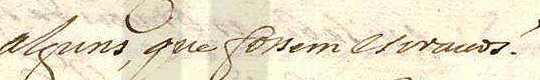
alguns, que fossem escrauos?
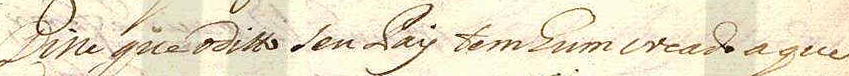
Disse, que o ditto seu Pay tem hum creado a que
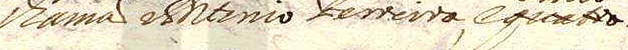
chamaõ Antonio Ferreira, e quatro
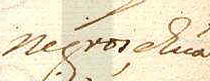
negros, e huā
